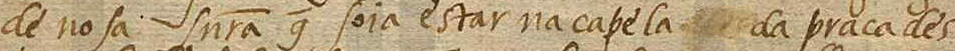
de nosa snr̄a q̄ soia estar na capela _ da praca des
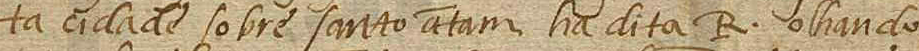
ta cidade sobre santo ātam ha dita R. olhando
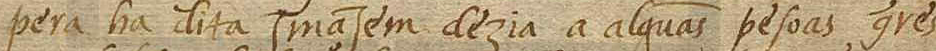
pera ha dita JmaJem dezia a algūas pesoas q̄res
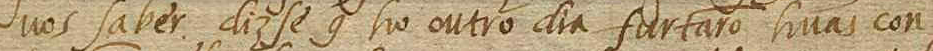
uos saber dizse q̄ ho outro dia furtāro hūas con
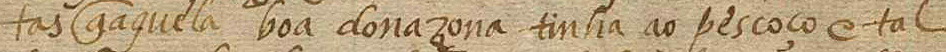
tas q̄ aquela boa donazona tinha ao pescoço e tal
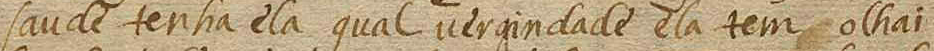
saude tenha ela qual uergindade ela tem olhai
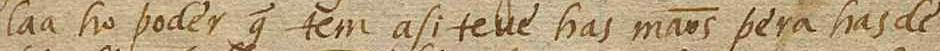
laa ho poder q̄ tem asi teue has mãos pera has de
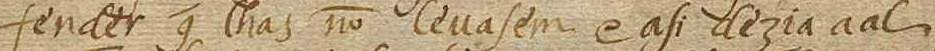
fender q̄ lhas n̄o leuasem e asi dezia a al
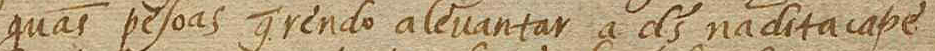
guāas pesoas q̄rendo aleuantar a ds̄ na dita cape
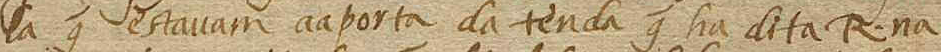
la q̄ estauam aa porta da tenda q̄ ha dita R. na
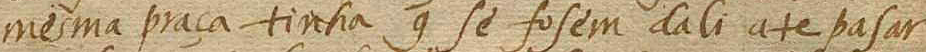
mesma praça tinha q̄ se fosem dali ate pasar
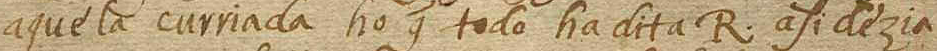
aquela curriada ho q̄ todo ha dita R. asi dezia
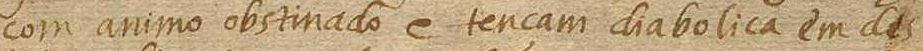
com animo obstinado e tençam diabolica em des
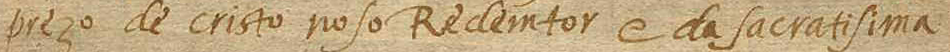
prezo de cristo noso Redemtor e da sacratisima
